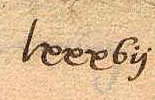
lxxxbij
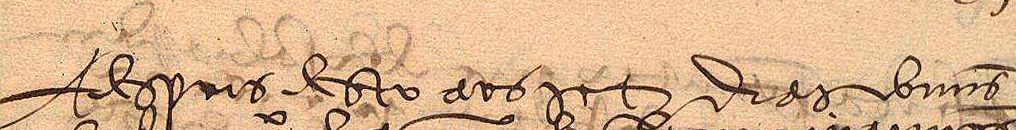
E despois desto aos sete dias do mes
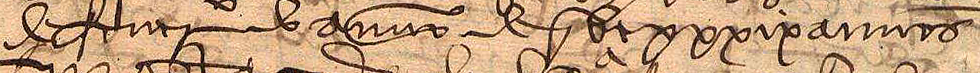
de feuero do anno de j̄ bc xxxix annos
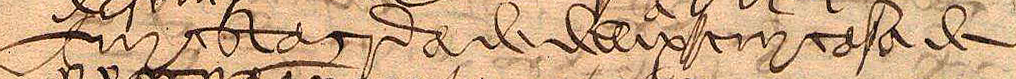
Em esta cjdade de llixa / em casa de
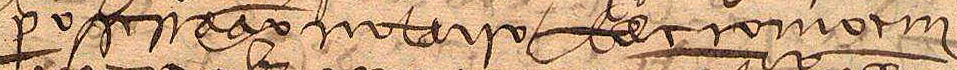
ꝑo sserraão notairo / Elle como em
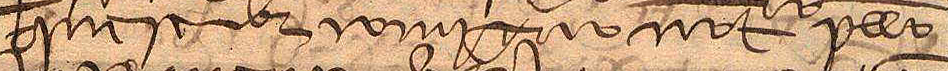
queredor comjguo notro p̄llo
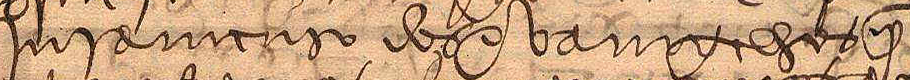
Juramento dos evamgelhos p̄
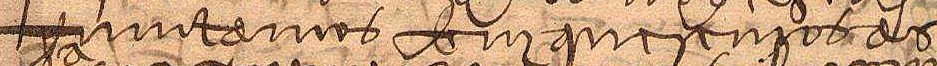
gumtamos E emqueremos as
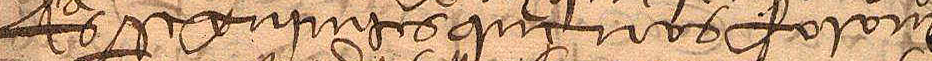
tas ssegujmtes que nos forom
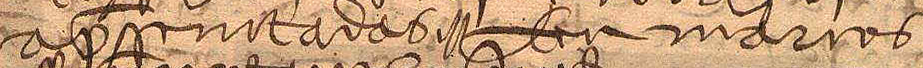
ap̄ssemtadas // E eu marcos
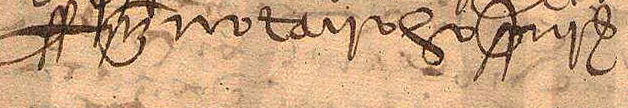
ffrz̄ notarjo ho sp̄uj
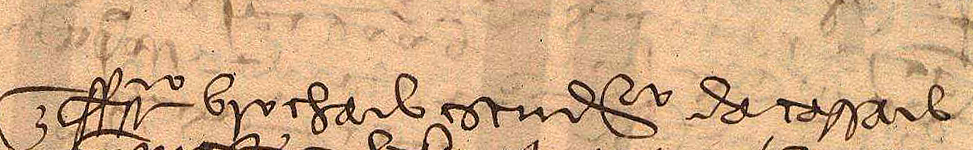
item ffrrco brochado escudro da cassa do
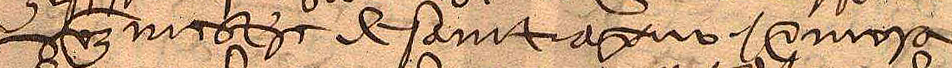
sōr mestre de samtiaguo / e mora
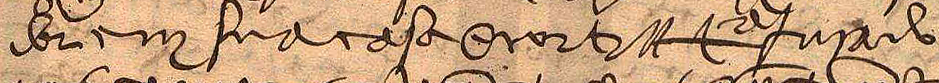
dor em sua casa e corte // ta Jurado
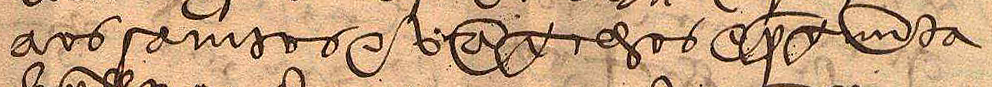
aos samtos evāgelhos e p̄gun̄ta
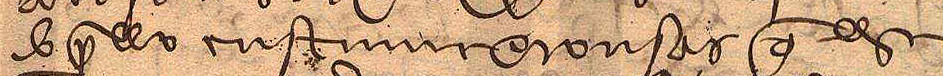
do p̄llo custume e cousas q̄ lhe
